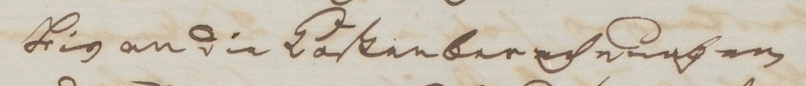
Bis an die Kostenberechnungen
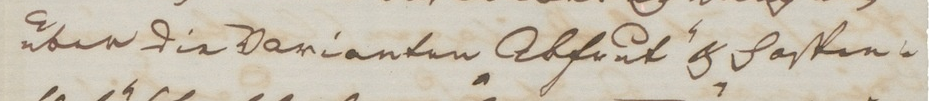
über die Varianten «Abfrut & Hospen-
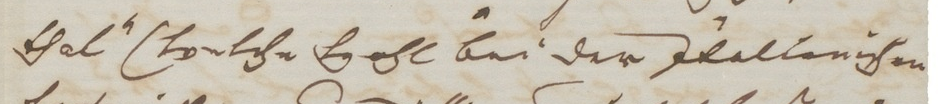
thal» (welche wohl bei der italienischen
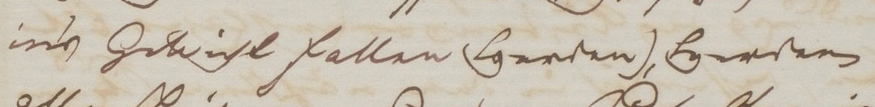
in's Gewicht fallen werden), werden
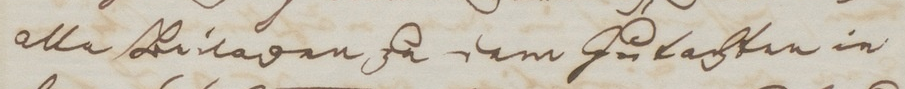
alle Beilagen zu dem Gutachten in
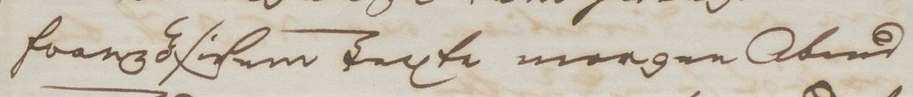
französischem Texte morgen Abend
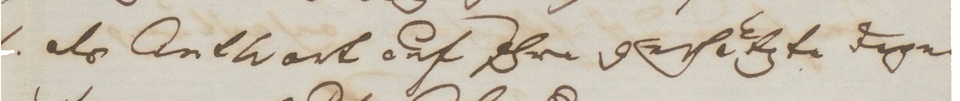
als Antwort auf Ihre geschätzte Depe-
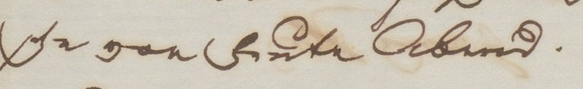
sche von heute Abend.
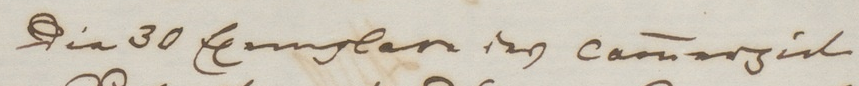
Die 30 Exemplare des commerziel-
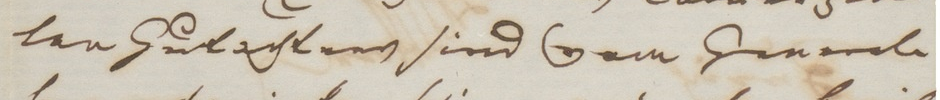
len Gutachtens sind vom General-
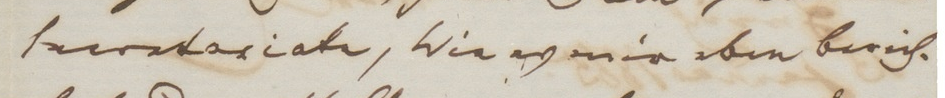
secretariate, wie es mir eben berich-
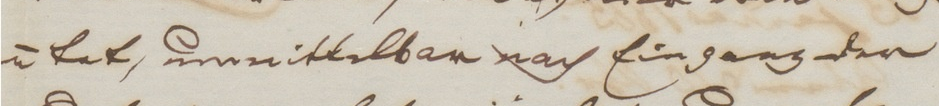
tet, unmittelbar nach Eingang der
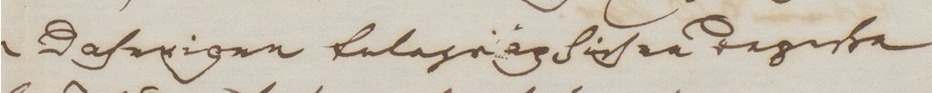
daherigen telegraphischen Depesche
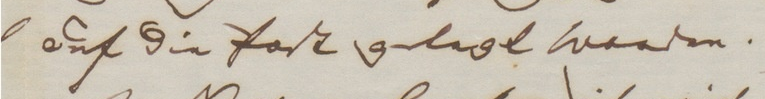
auf die Post gelegt worden.
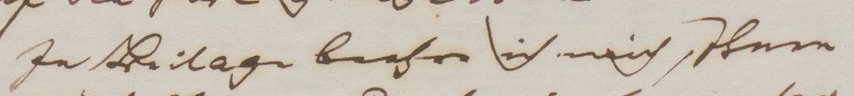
In Beilage beehre ich mich, Ihnen
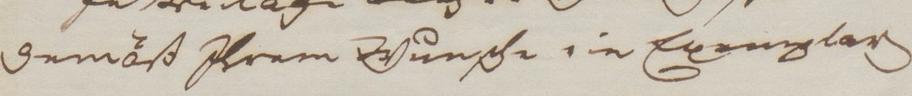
gemäß Ihren Wunsche ein Exemplar
